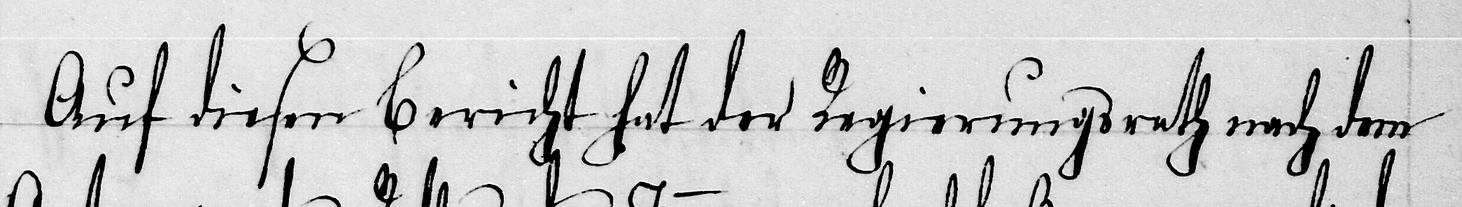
Auf diesen Bericht hat der Regierungsrath nach dem
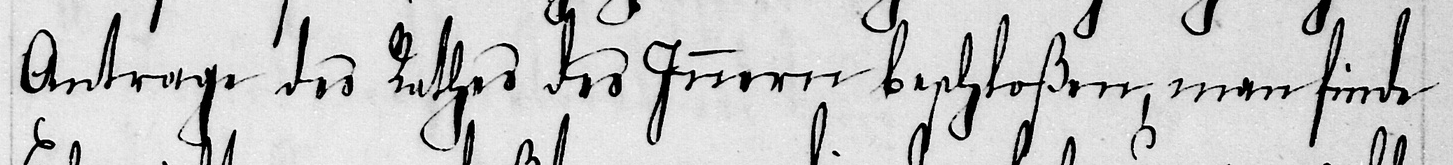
Antrage des Rathes des Innern beschloßen, man finde
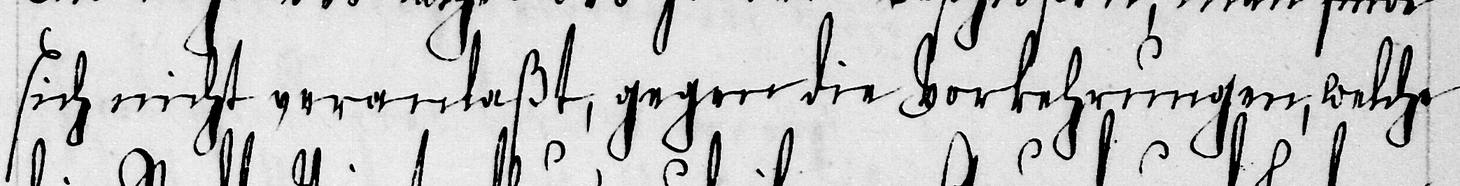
sich nicht veranlaßt, gegen die Vorkehrungen, welche
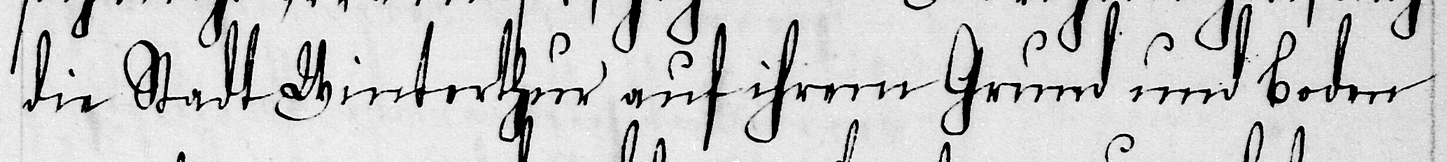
die Stadt Winterthur auf ihrem Grund und Boden
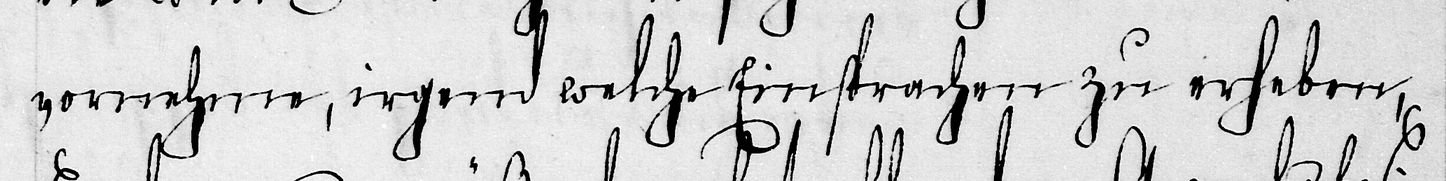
vornehme, irgend welche Einsprachen zu erheben,
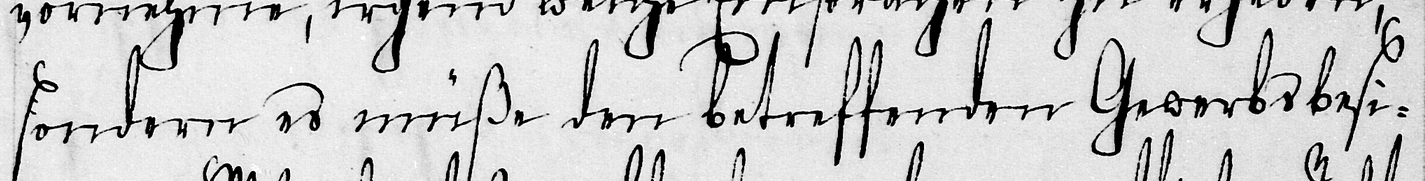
sondern es müße den betreffenden Gewerbsbesi¬
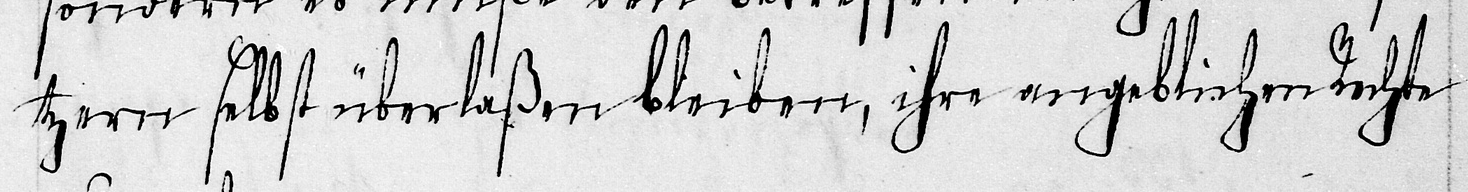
tzern selbst überlaßen bleiben, ihre angeblichen Rechte
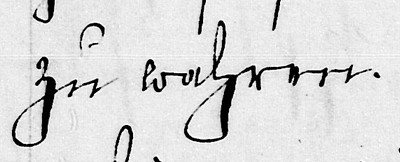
zu wahren.
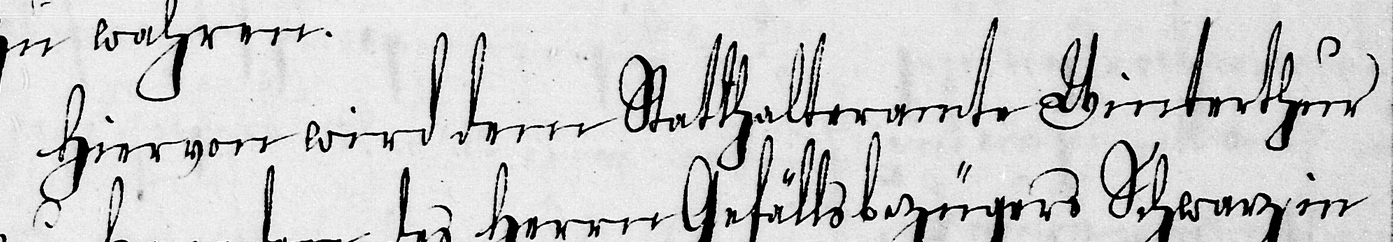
Hiervon wird dem Statthalteramte Winterthur
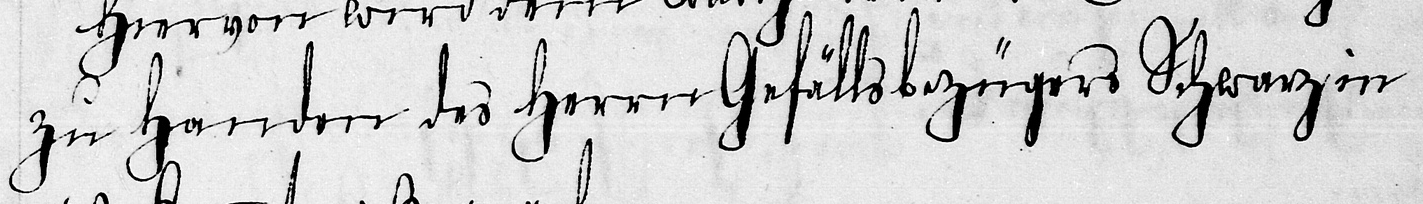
zu Handen des Herrn Gefällsbezügers Schwarz in
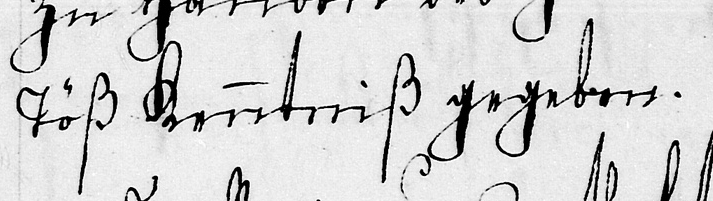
Töß Kenntniß gegeben.
